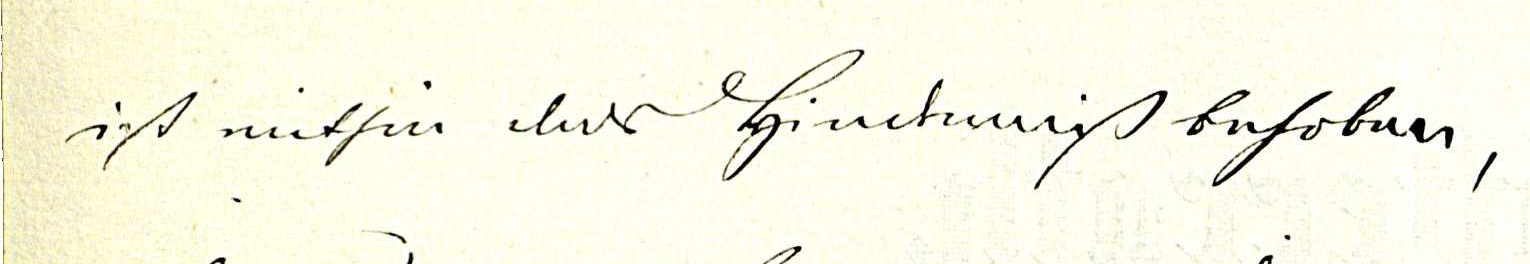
ist mithin das Hinxx behoben,
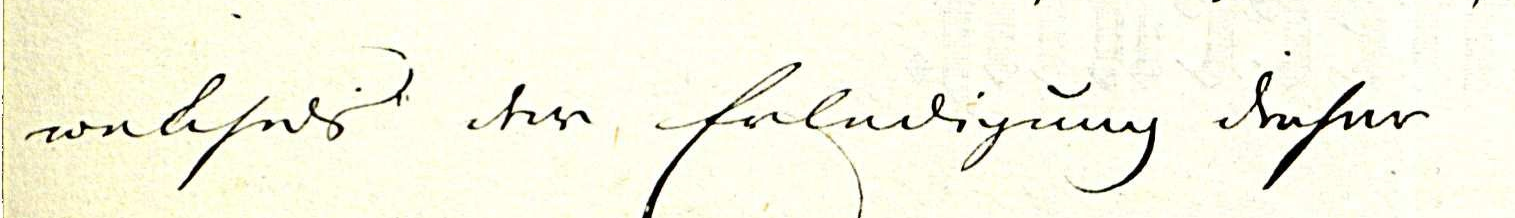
wexx der Erledigung dieser
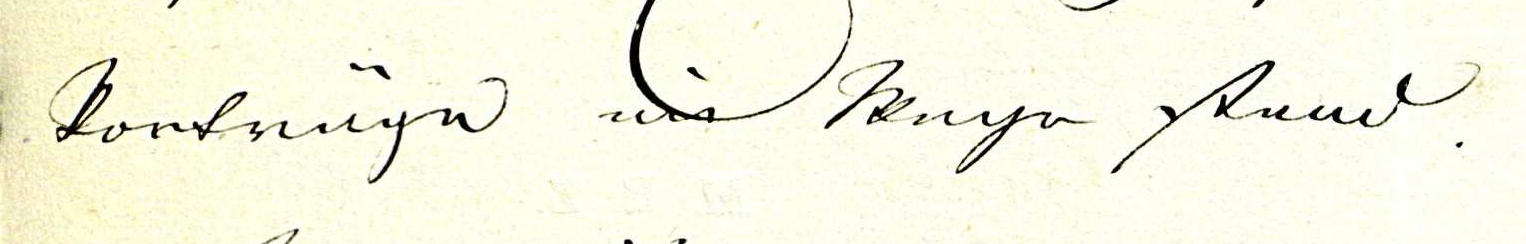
Vorträge im Wege stand.
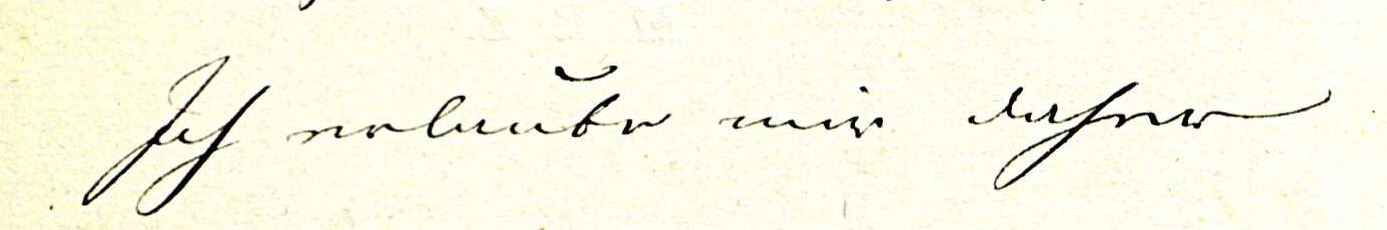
Jch erlaube mir daher
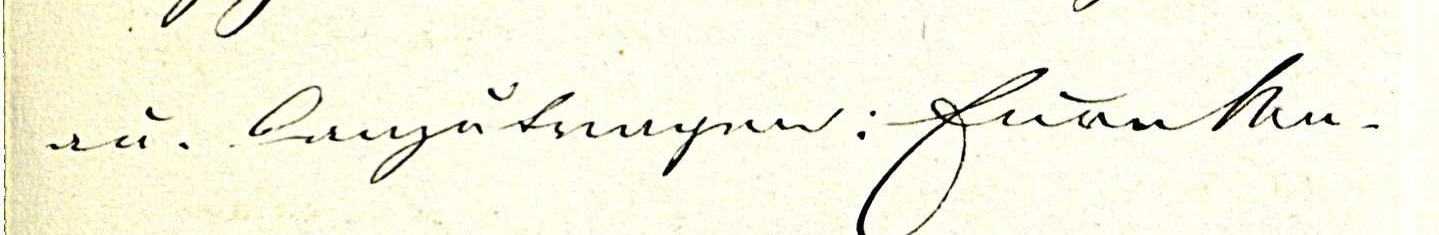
au. xxanzutragen: Eure Ma¬
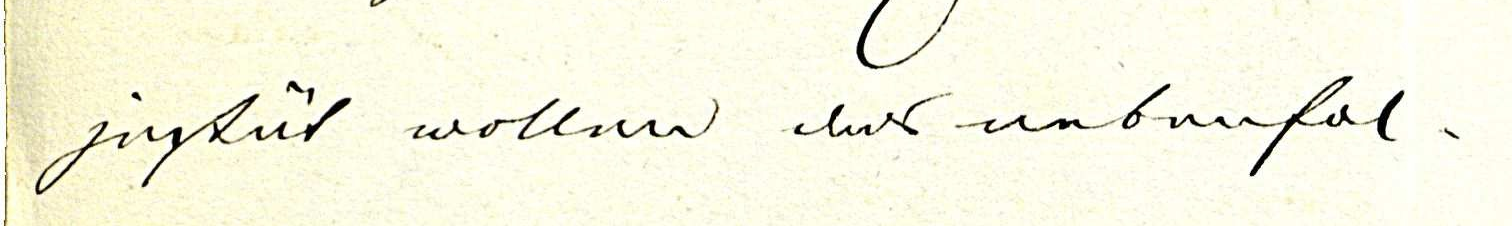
jestät wollen der neben¬
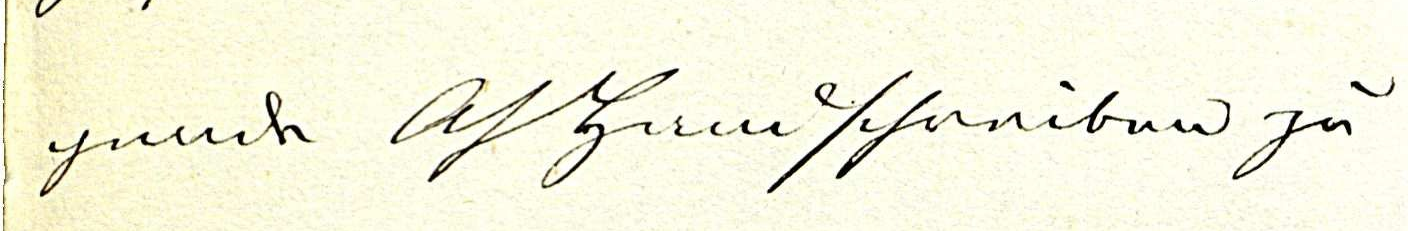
folgende Ah Ham schreiben zu
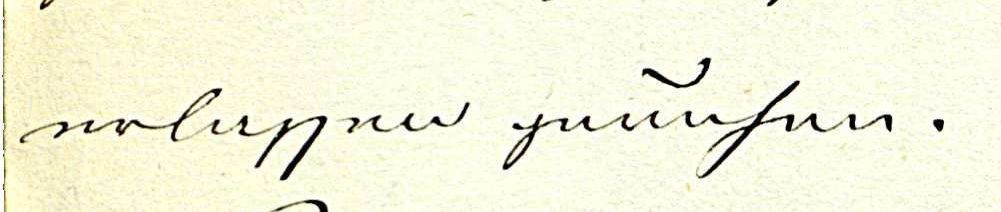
erlassen xx.
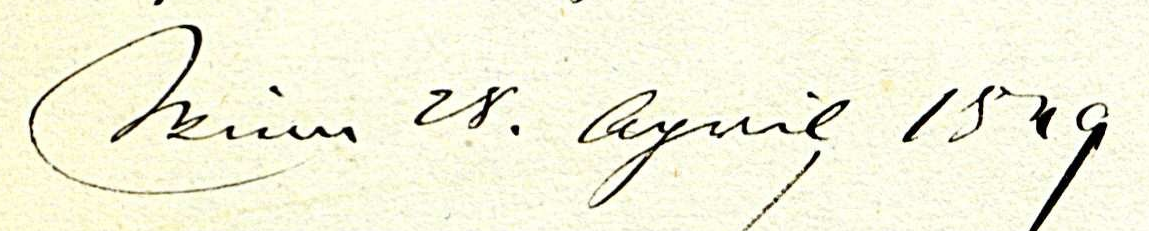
Wien 28. April 1849
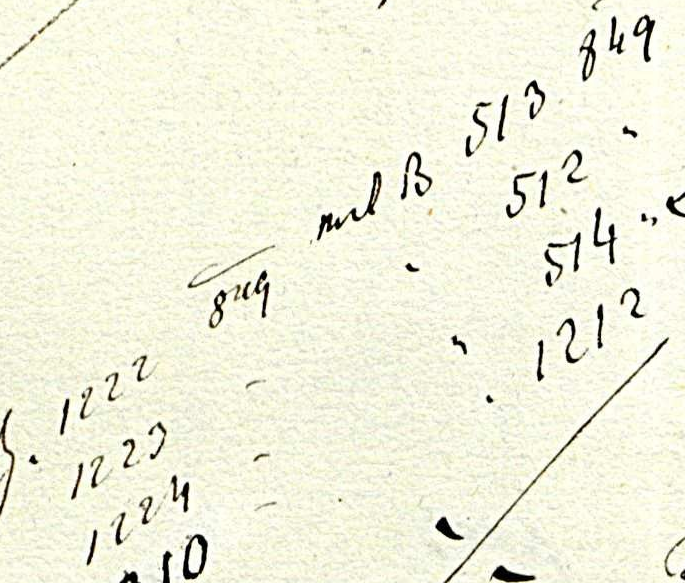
1223 - xx 512 849
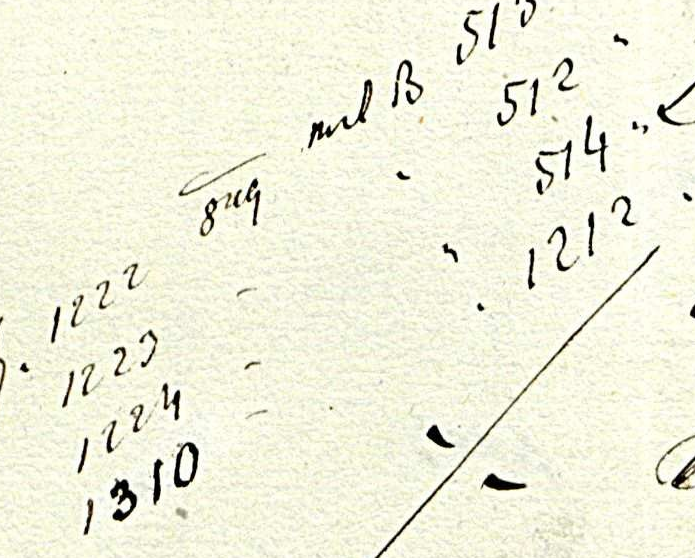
1224 - xx 514 849
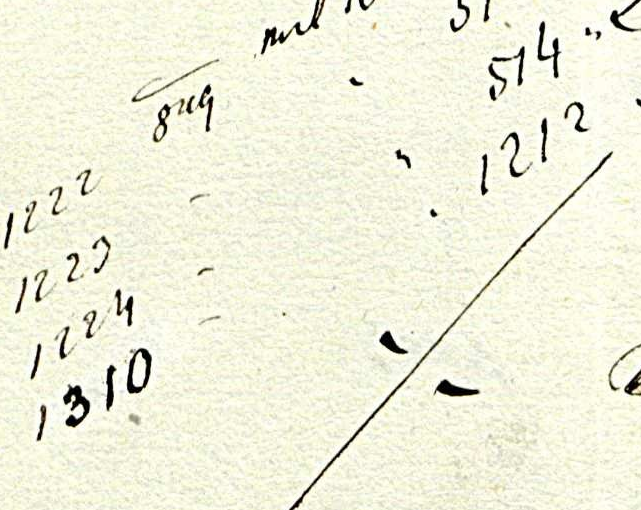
1310 - xx 1212 849
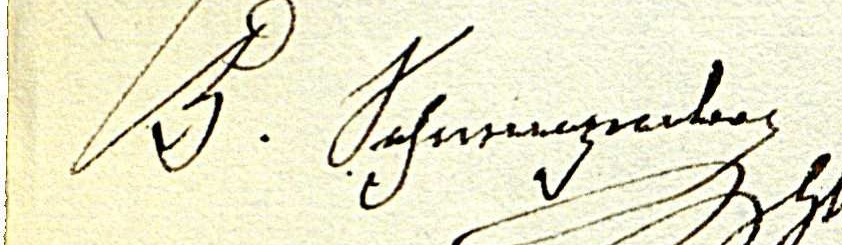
xx. Schwengenten
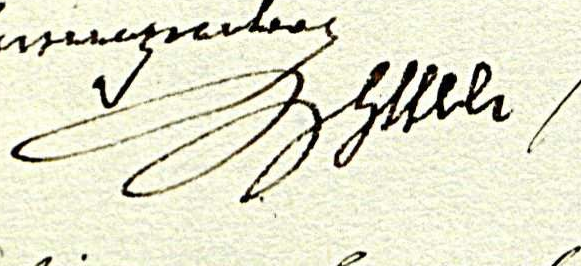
xx
